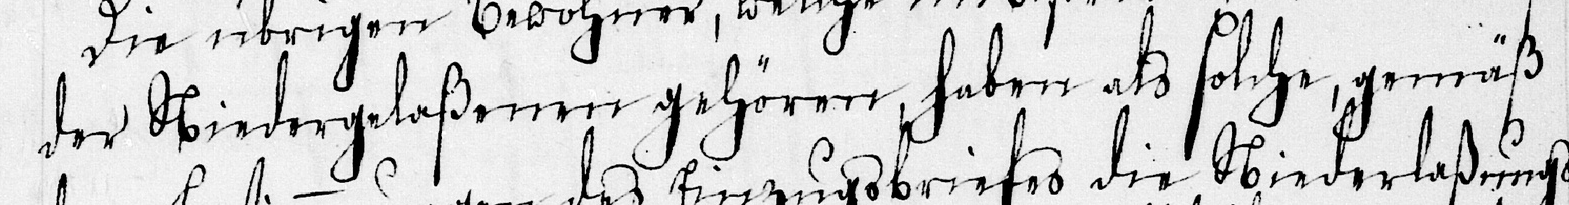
der Niedergelaßenen gehören, haben als solche, gemäß
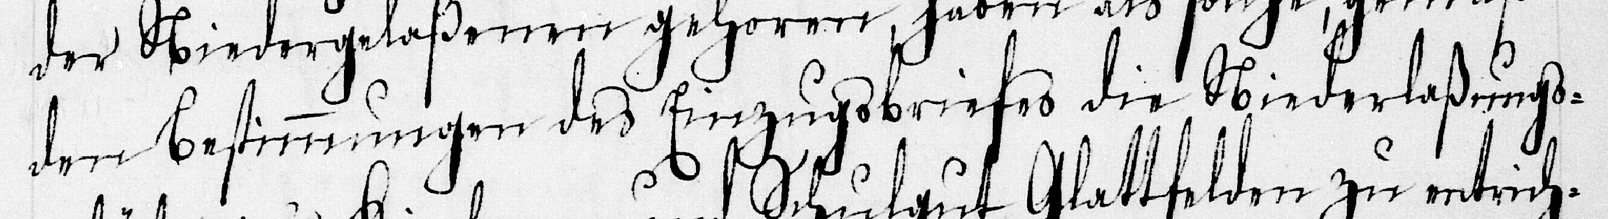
den Bestimmungen des Einzugsbriefes die Niederlaßungs¬
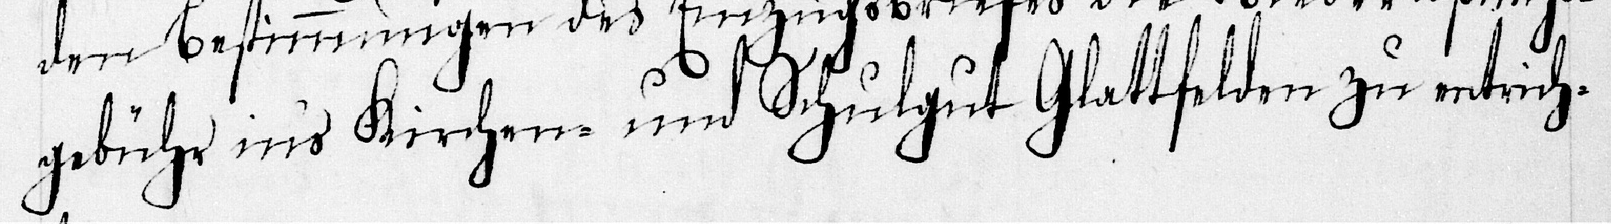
gebühr in’s Kirchen- und Schulgut Glattfelden zu entrich¬
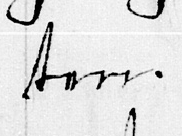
ten.
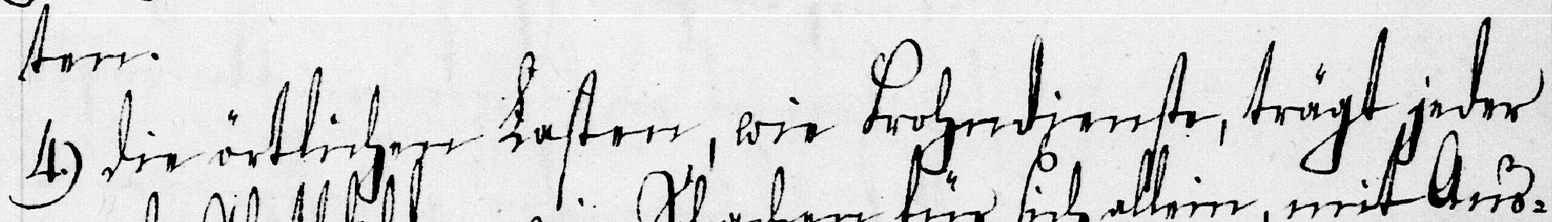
4.) die örtlichen Lasten, wie Frohndienste, trägt jeder
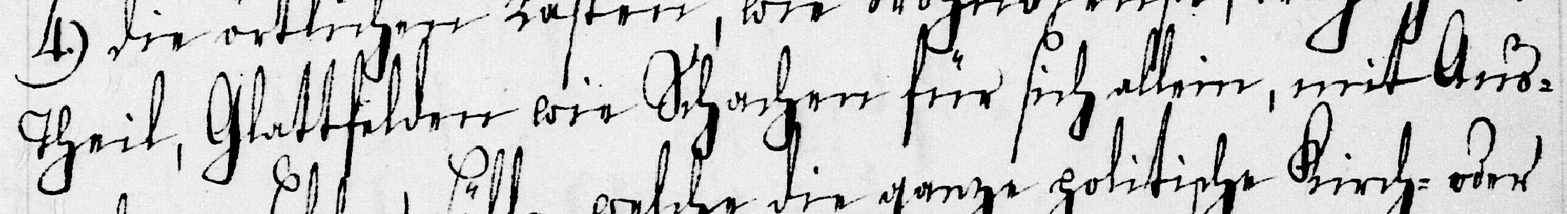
Theil, Glattfelden wie Schachen für sich allein, mit Aus¬
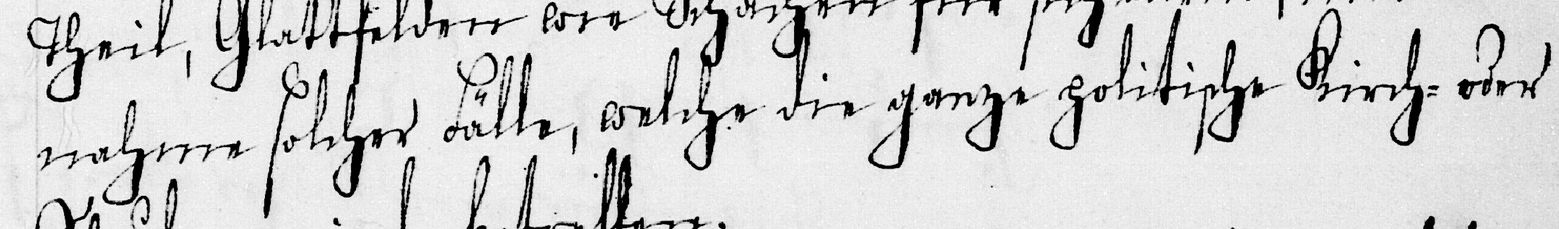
nahme solcher Fälle, welche die ganze politische Kirch- oder
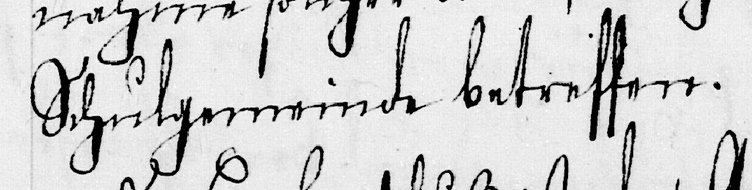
Schulgemeinde betreffen.
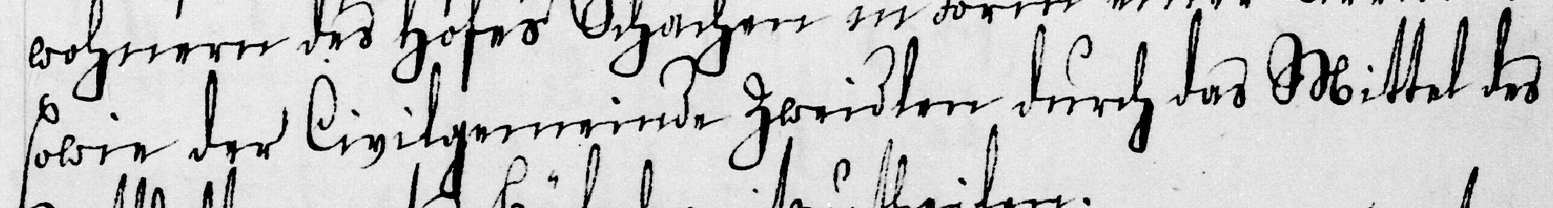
sowie der Civilgemeinde Zweidlen durch das Mittel des
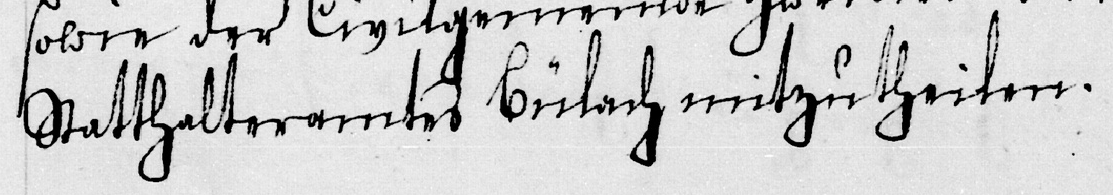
Statthalteramtes Bülach mitzutheilen.
